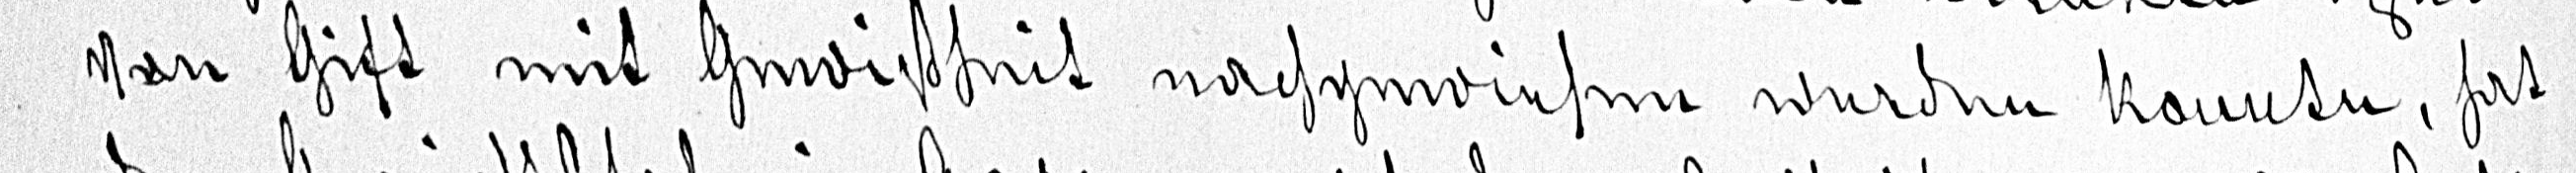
von Gift mit Gewißheit nachgewiesen werden konnte, hat
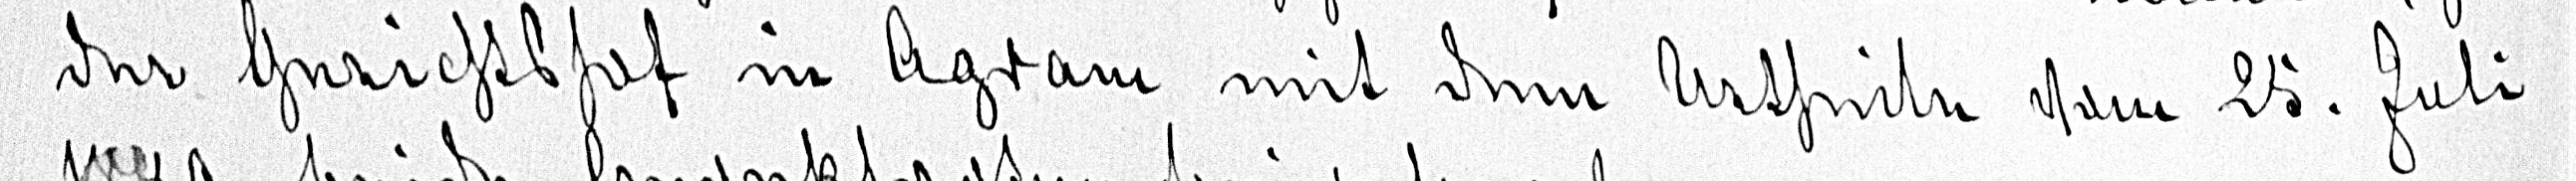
der Gerichtshof in Agram mit dem Urtheile vom 25. Juli
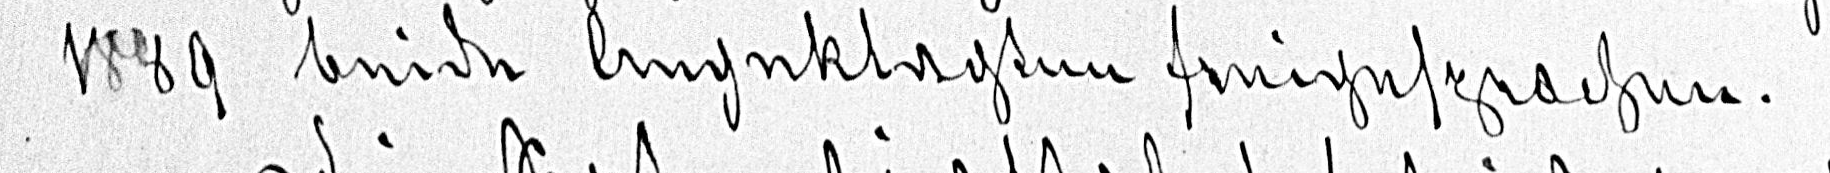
1889 beide Angeklagten freigesprochen.
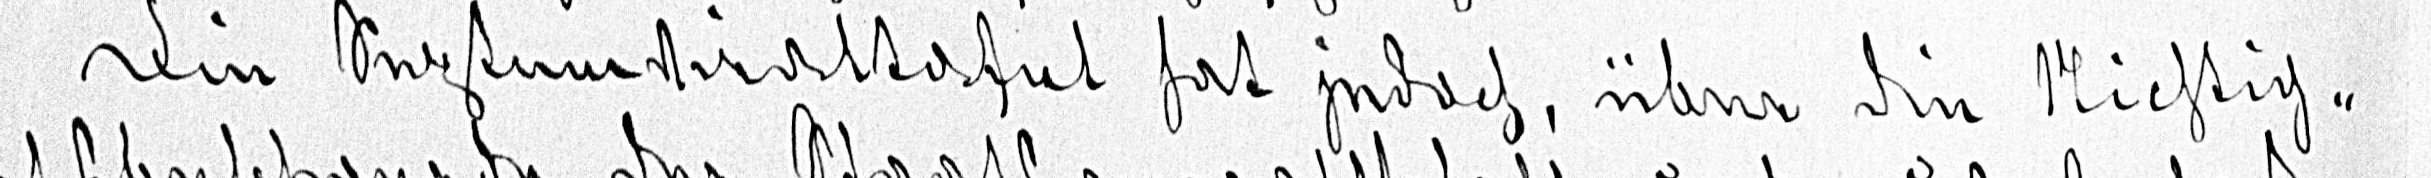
Die Septemviraltafel hat jedoch, über die Nichtig¬
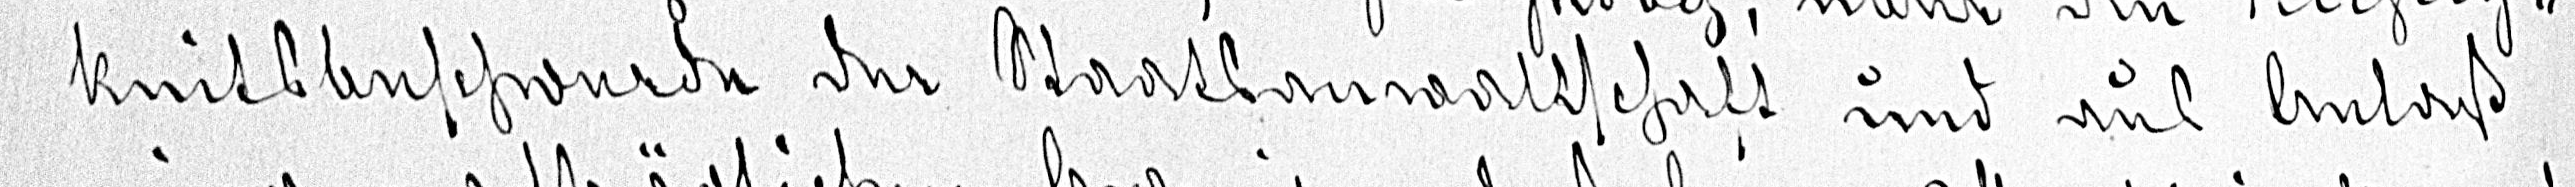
keitsbeschwerde der Staatsanwaltschaft und aus Anlaß
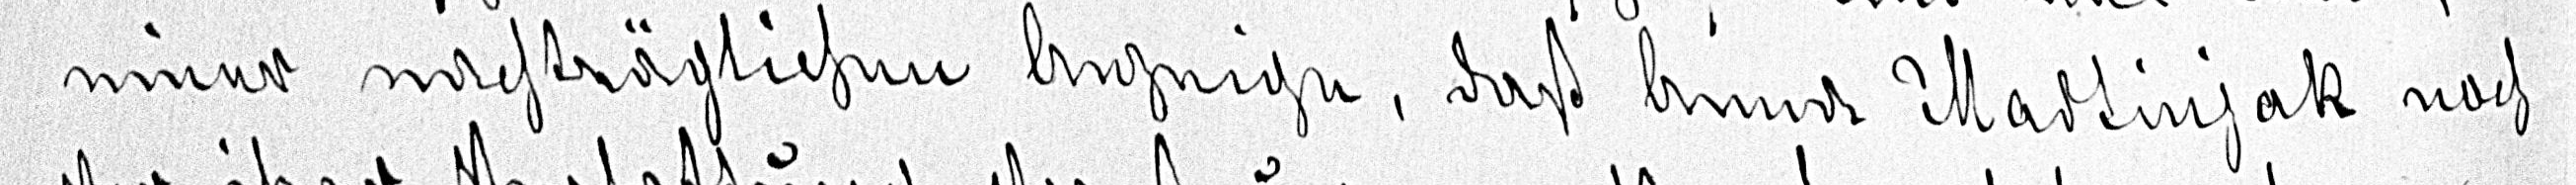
einer nachträglichen Anzeige, daß Anna Martinjak noch
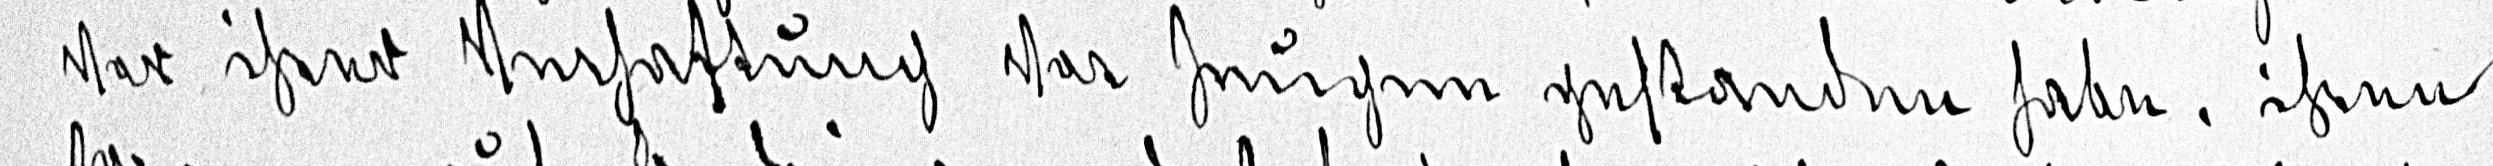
vor ihrer Verhaftung vor Zeugen gestanden habe, ihren
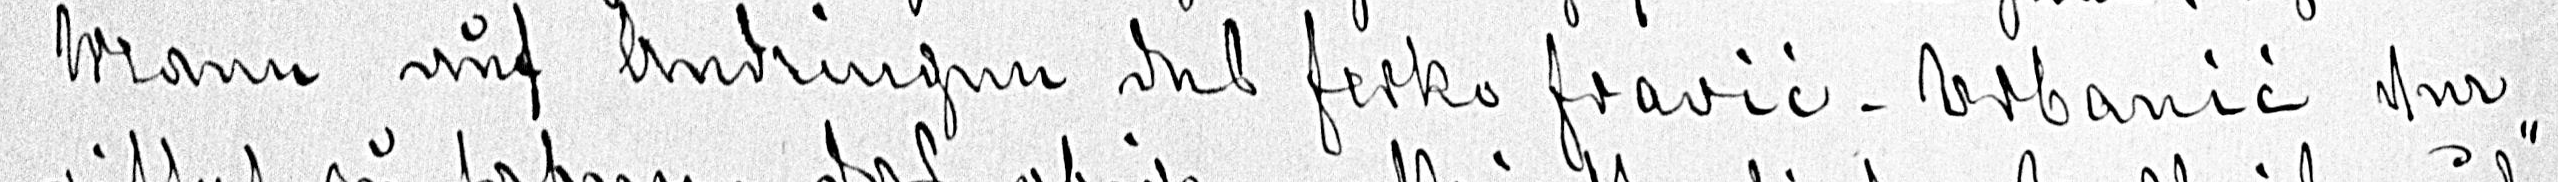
Mann auf Andringen des Ferko Fravić-Vrbanić ver¬
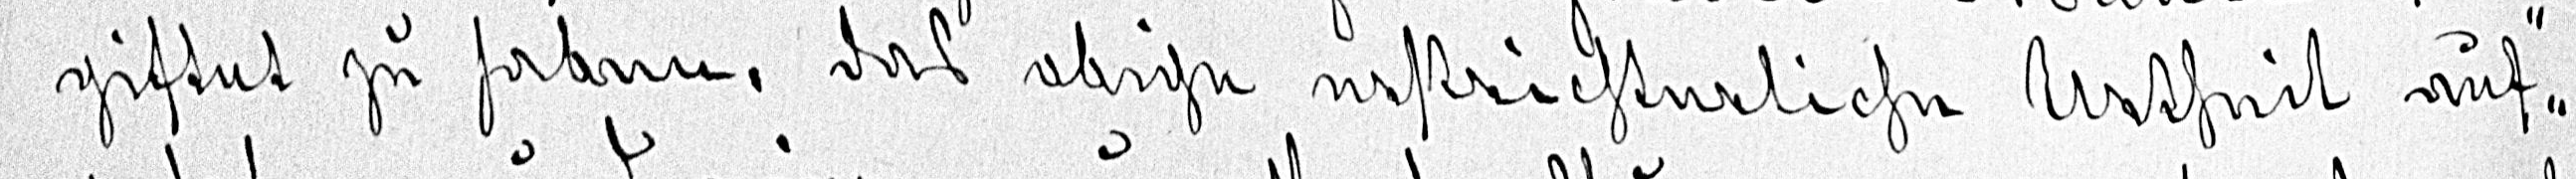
giftet zu haben, das obige erstrichterliche Urtheil auf¬
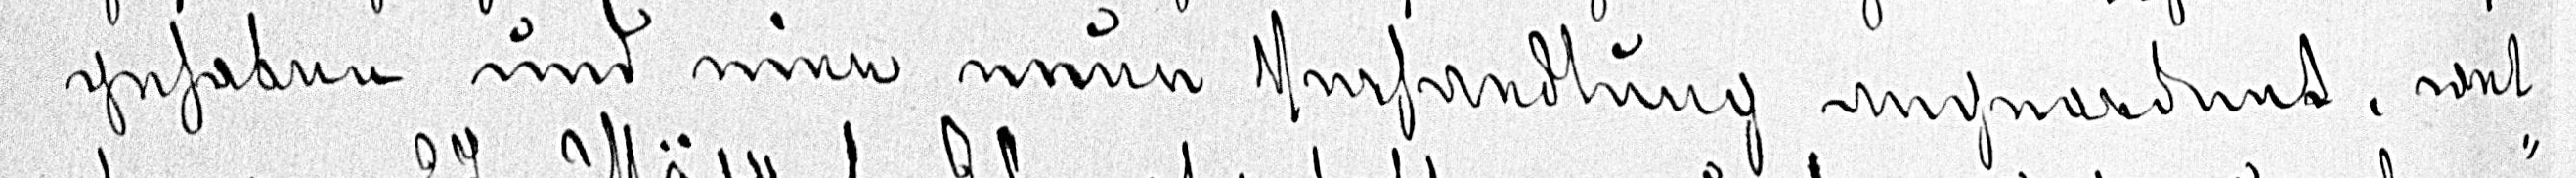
gehaben und eine neun Verhandlung angeordnet, wel¬
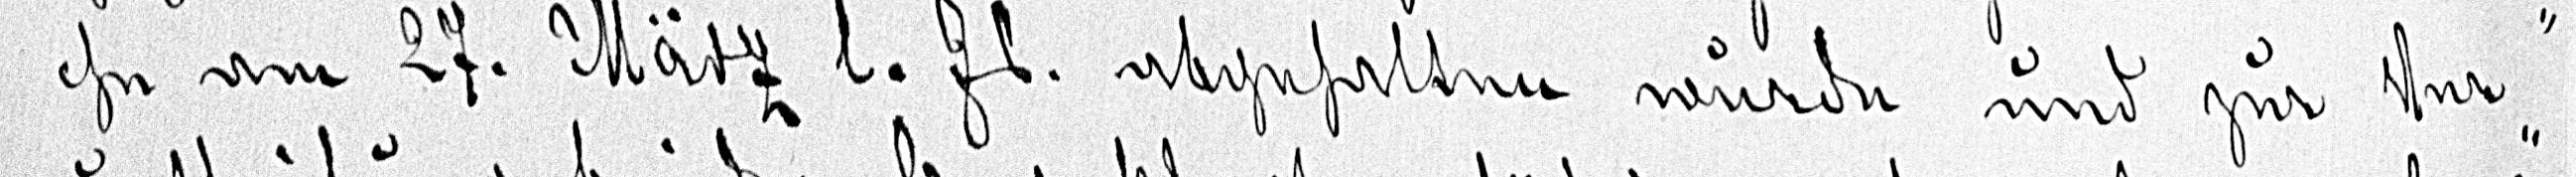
che am 27. März l. Js. abgehalten wurde und zur Ver¬
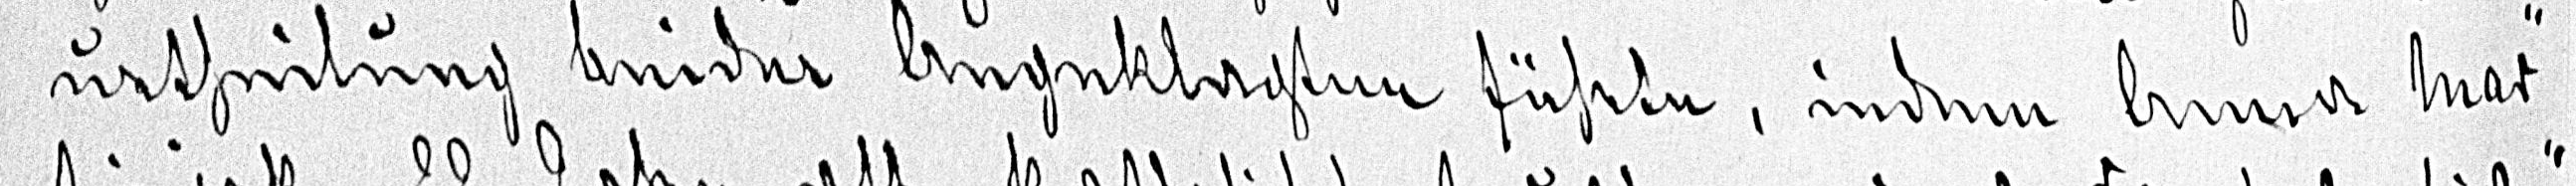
urtheilung beider Angeklagten führte, indem Anna Mar¬
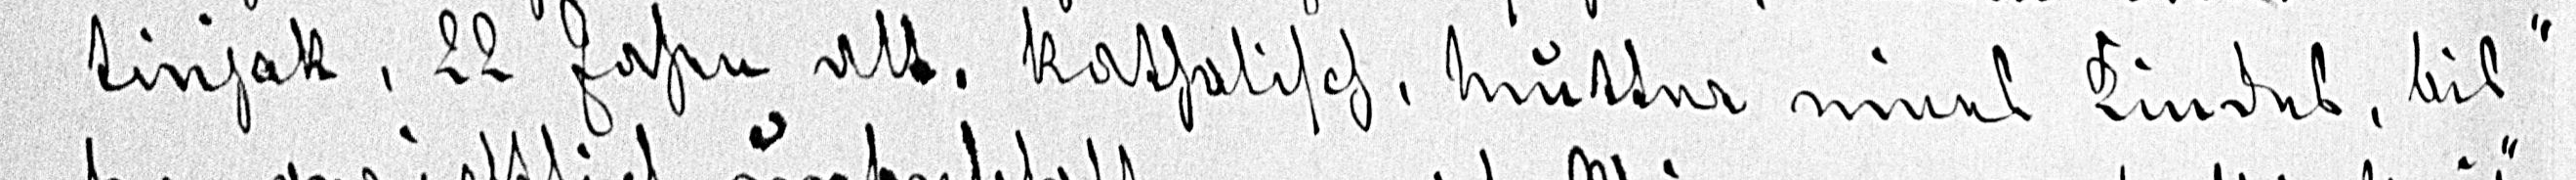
tinjak, 22 Jahre alt. katholisch, Mutter eines Kindes, bis¬
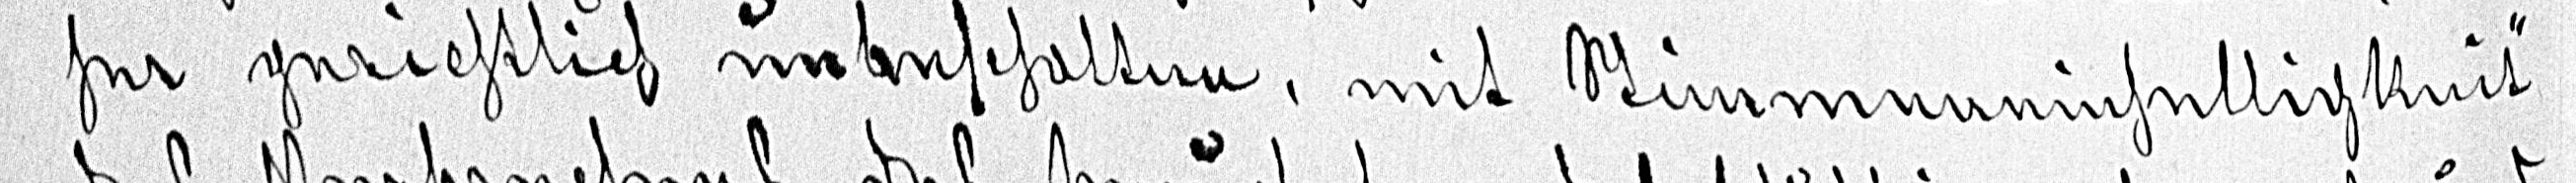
her gerichtlich unbescholten, mit Stimmeneinhelligkeit
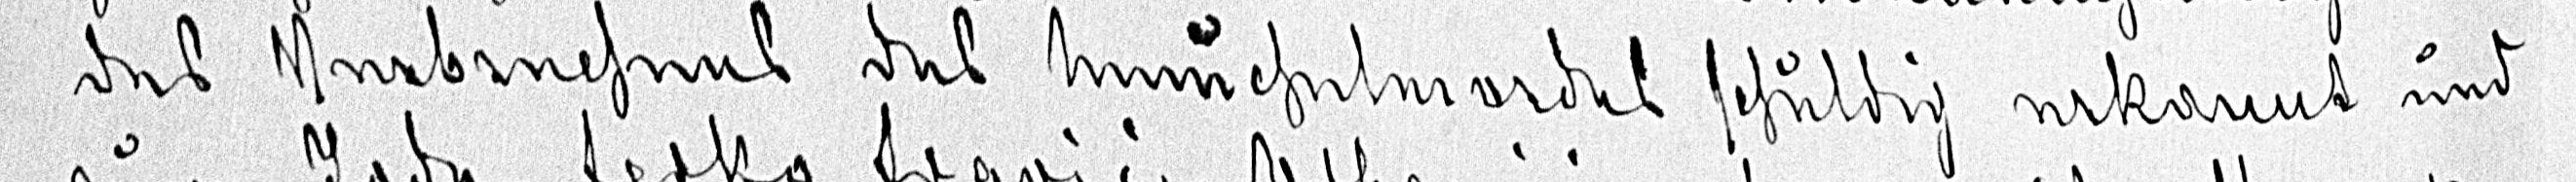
des Verbrechens des Meuchelmordes schuldig erkannt und
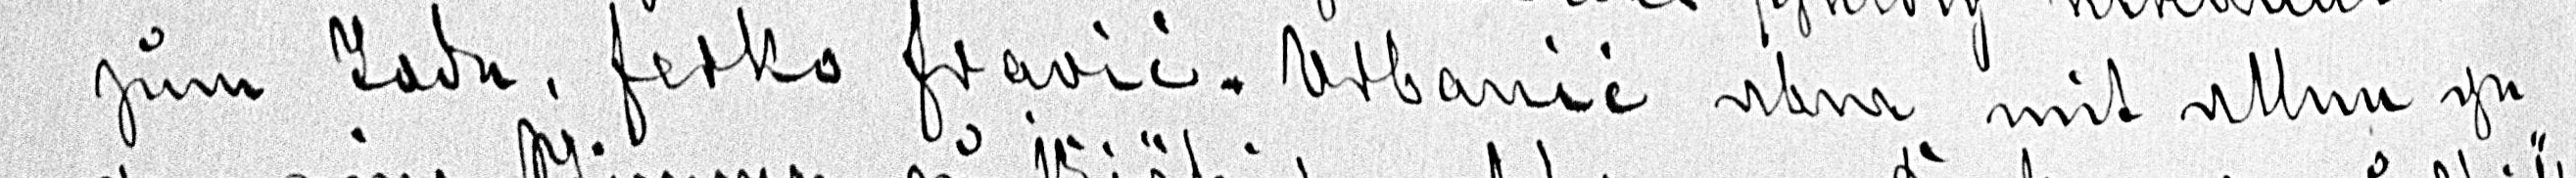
zum Tode, Ferko Fravić-Vrbanić aber mit allen ge¬
